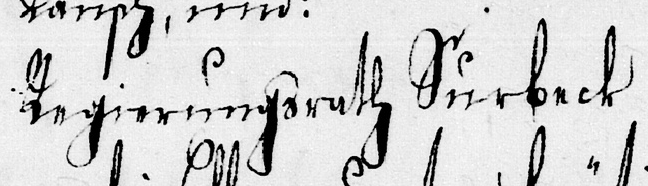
Regierungsrath Surbeck.
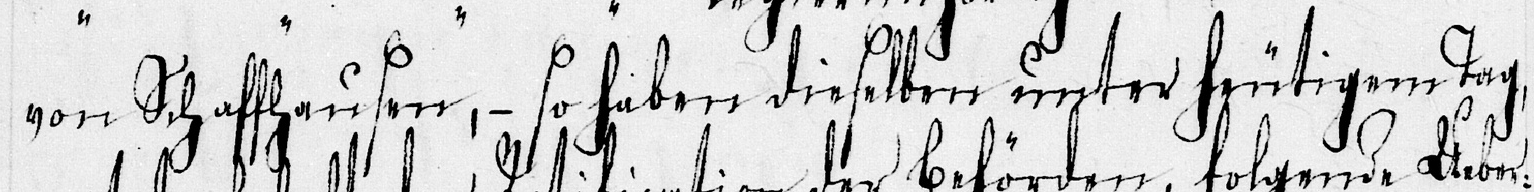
von Schaffhausen,– so haben dieselben unter heutigem Tag,
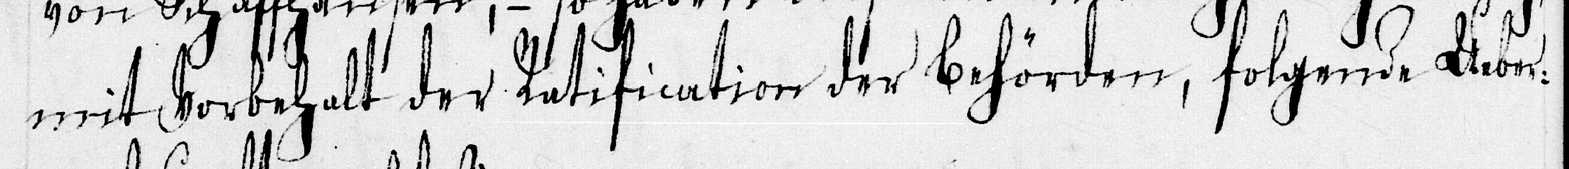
mit Vorbehalt der Ratification der Behörden, folgende Ueber¬
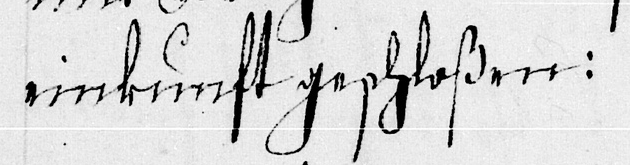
einkunft geschloßen:
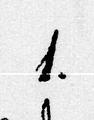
1.
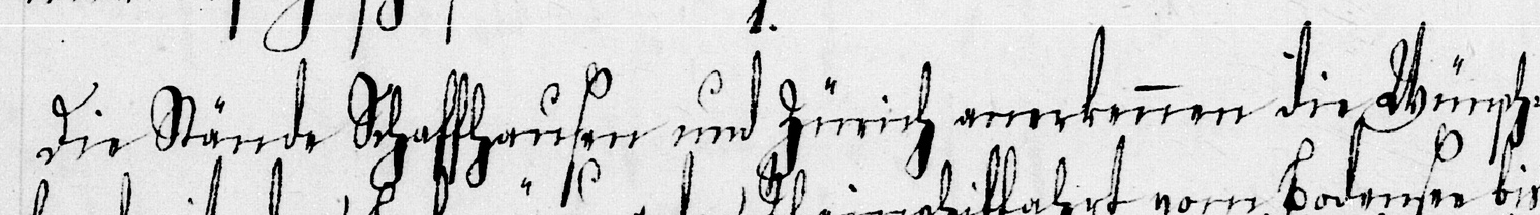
Die Stände Schaffhausen und Zürich anerkennen die Wün¬
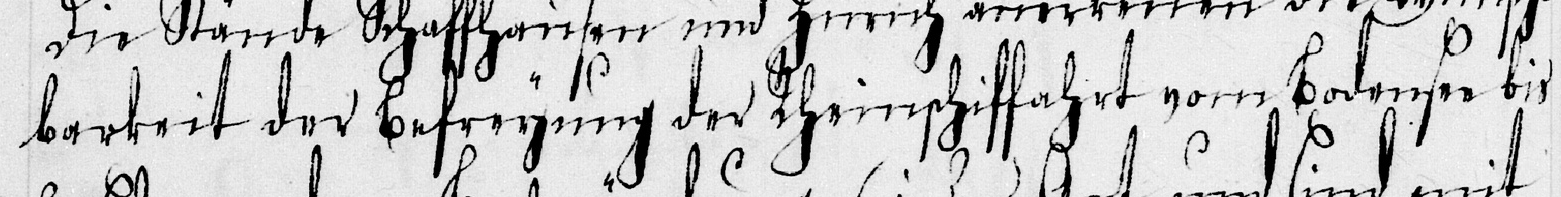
barkeit der Befreyung der Rheinschiffahrt von Bodensee bis
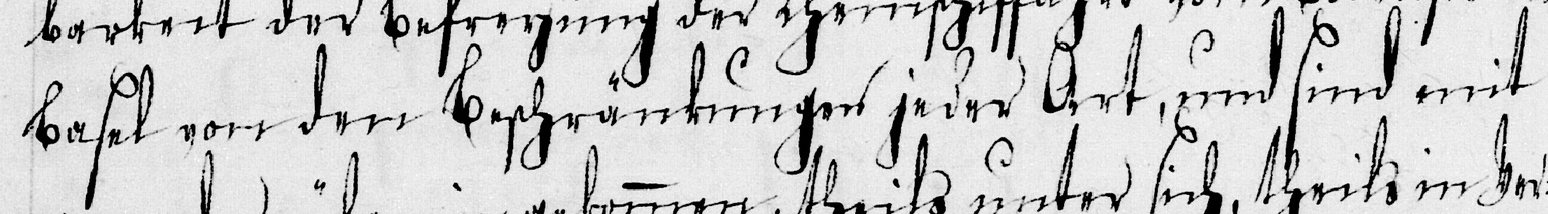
Basel von den Beschränkungen jeder Art, und sind mit
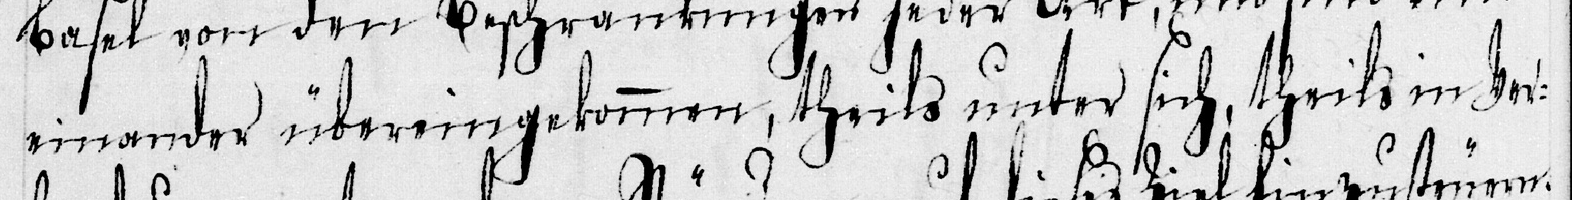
einander übereingekommen, theils unter sich, theils in Ver¬
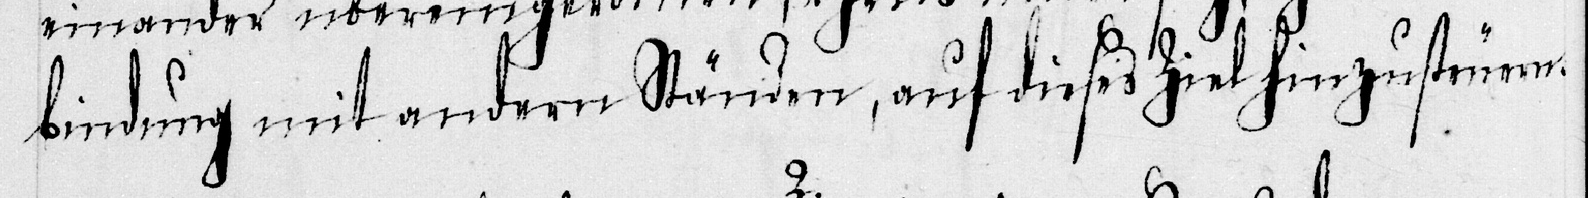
bindung mit andern Ständen, auf dieses Ziel hinzusteuern.
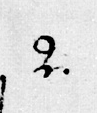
2.
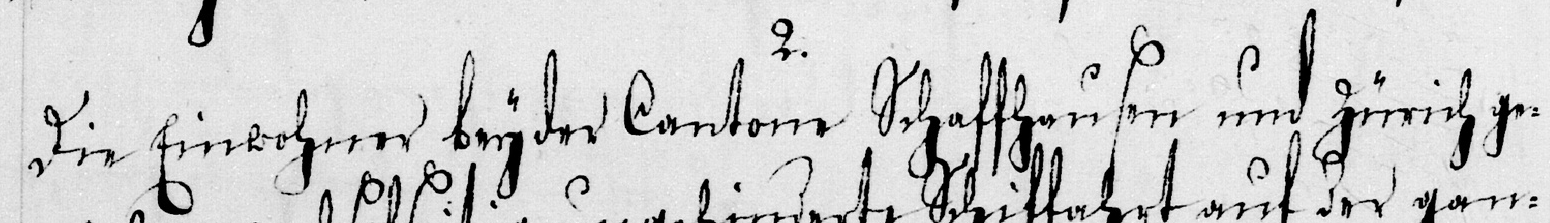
Die Einwohner beyder Cantone Schaffhausen und Zürich ge¬
